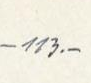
113
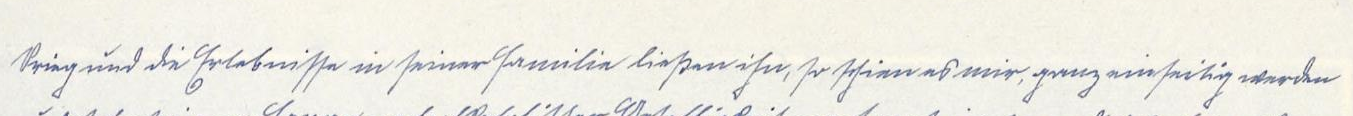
Krieg und die Erlebnisse in seiner Familie liesen ihn, so schien es mir, ganz einseitig werden
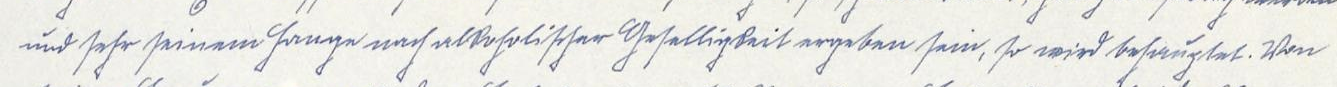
und sehr seinem Hange nach alkoholischer Geselligkeit ergeben sein, so wird behauptet. Von
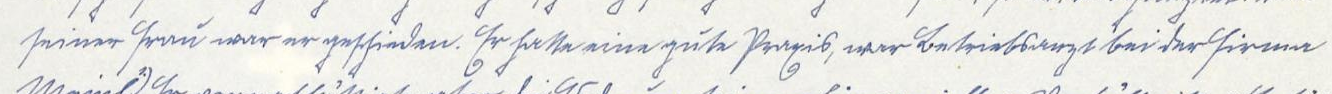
seiner Frau war er geschieden. Er hatte eine gute Praxis, war Betriebsarzt bei der Firma
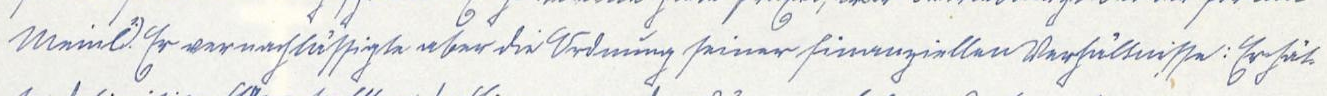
Meinl. Er vernachlässigte aber die Ordnung seiner finanziellen Verhältnisse. Er hät-
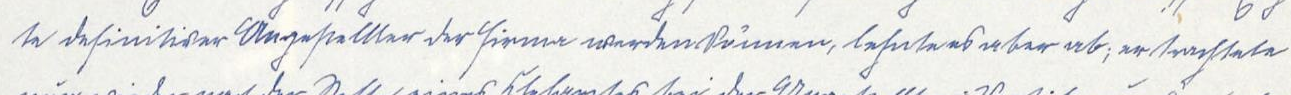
te definitiver Angestellte der Firma werden können, lehnte es aber ab; er trachtete
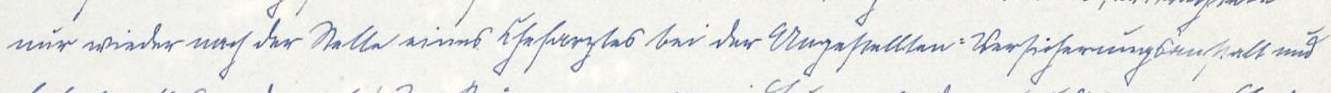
nur wieder nach der Stelle eines Chefarztes bei der Angestellten- Versicherungsanstalt und
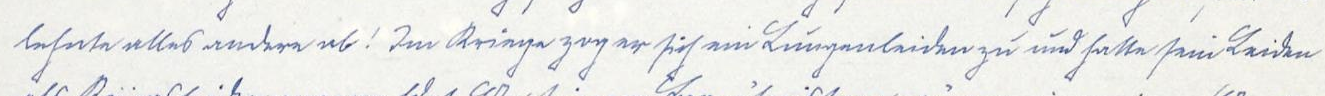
lehnte alles andere ab! Im Kriege zog er sich ein Lungenleiden zu und hatte sein Leiden
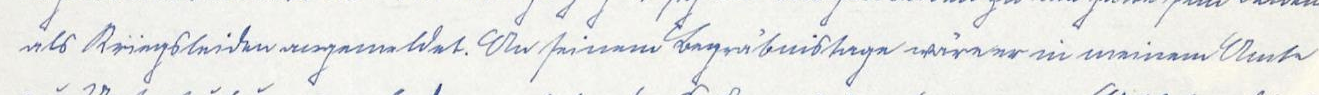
als Kriegsleiden angeneldet. An seinem Begräbnistage wäre er in meinem Amte
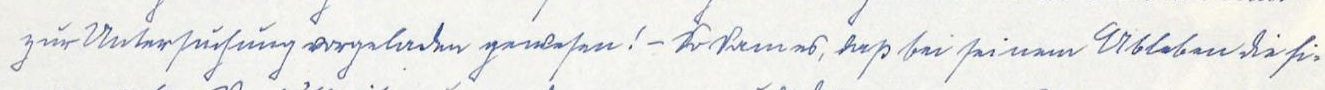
zur Untersuchung vorgeladen gewesen! So kam es, dass bei seinem Ableben die fi -
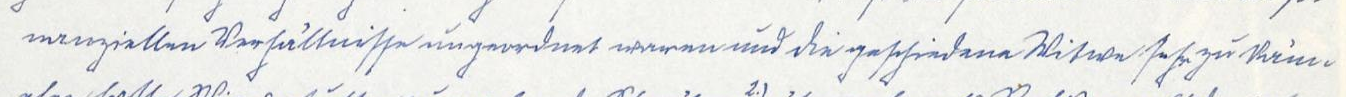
nanziellen Verhältnisse ungeordnet waren und die geschiedene Witwe sehr zu käm-
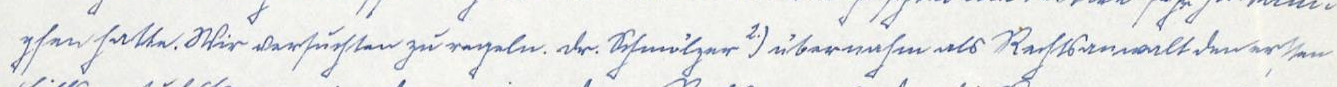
fen hatte. Wir versuchten zu regeln. Dr. Schmölzer 2) übernahm als Rechtsanwalt dem ersten
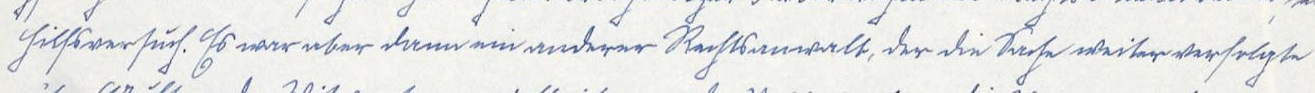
hilfsversuch. Es war aber dann ein anderer Rechtsanwalt, der die Sache weiterverfolgte,
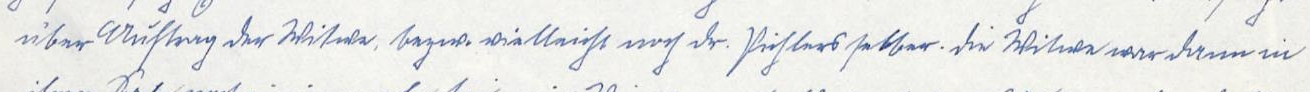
über Auftrag der Witwe, bzw. vielleicht noch Dr. Pichlers selber. Die Witwe war dann in
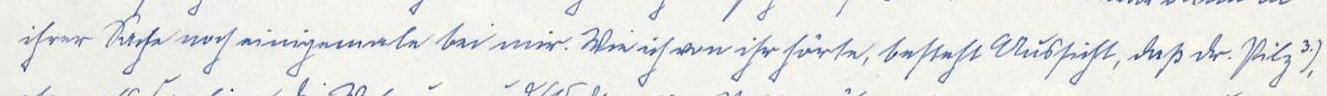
ihrer Sache noch einigemale bei mir. Wie ich von ihr hörte, besteht Aussicht, das Dr. Pilz 3)
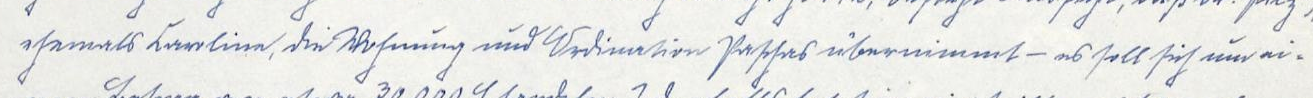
ehemals Caroline, die Wohnung und Ordination Paschas übernimmt- es soll sich um ei-
